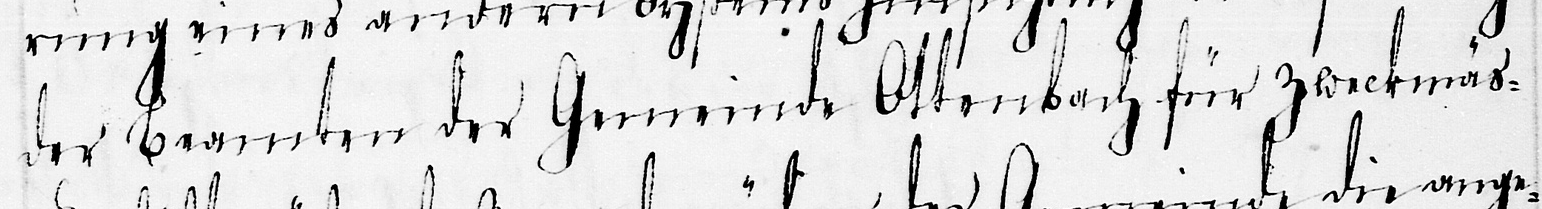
der Beamten der Gemeinde Ottenbach für zweckmäß¬
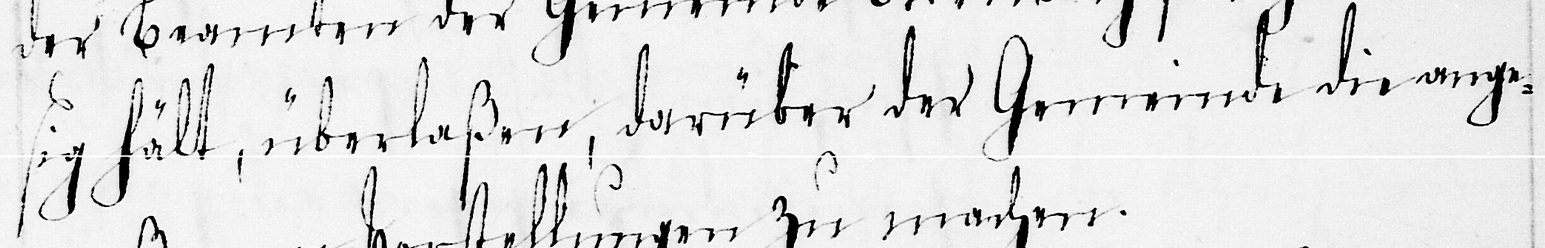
ig hält, überlaßen, darüber der Gemeinde die ange¬
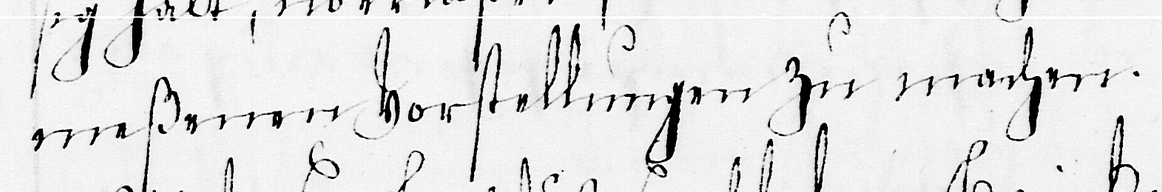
meßenen Vorstellungen zu machen.
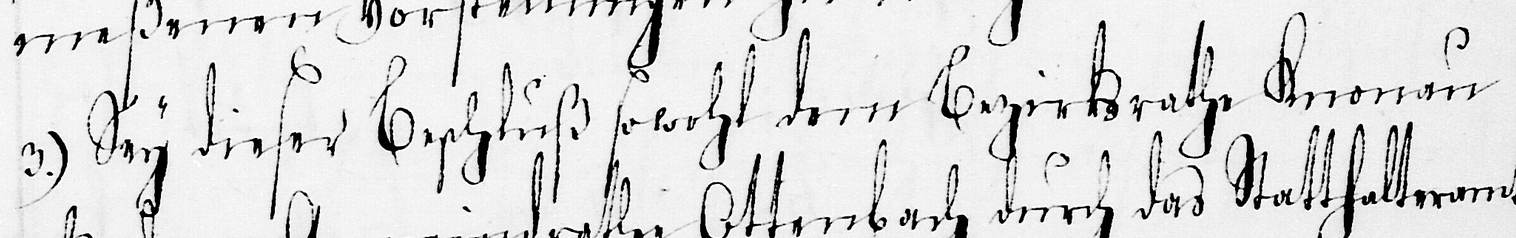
3.) Sey dieser Beschluß sowohl dem Bezirksrathe Knonau
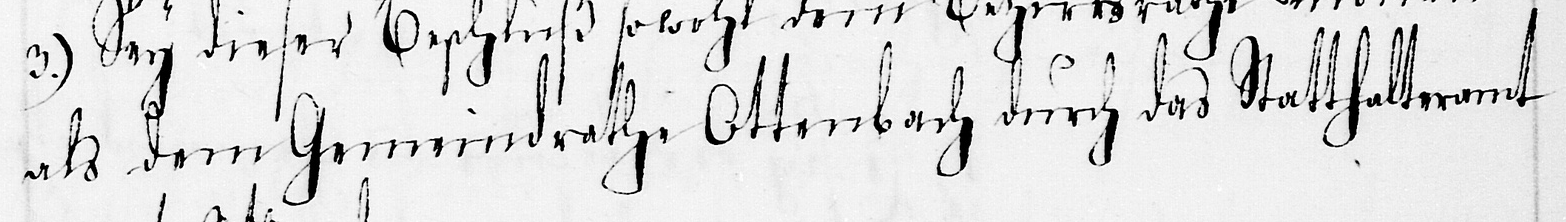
als dem Gemeindrathe Ottenbach durch das Statthalteramt
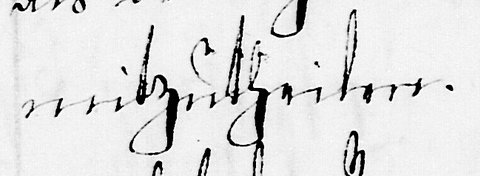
mitzutheilen.
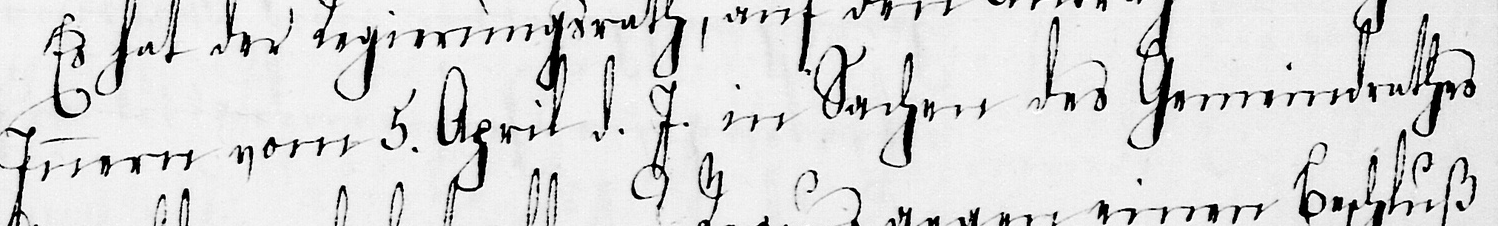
Innern vom 5. April d. J. in Sachen des Gemeindrathes
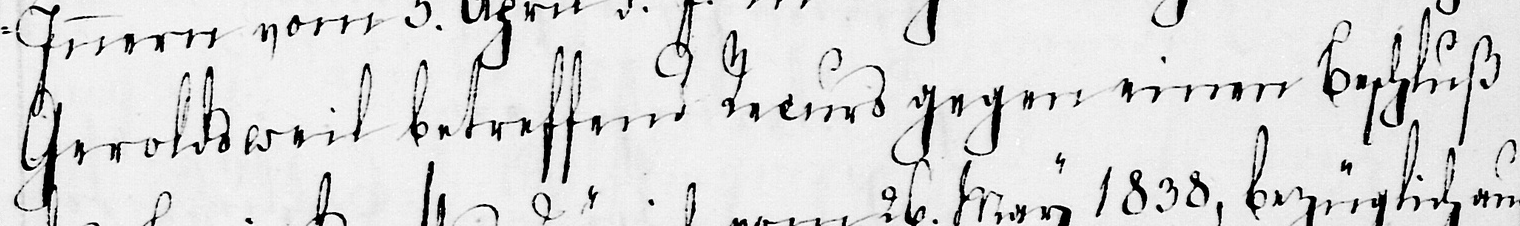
Geroldsweil betreffend Recurs gegen einen Beschluß
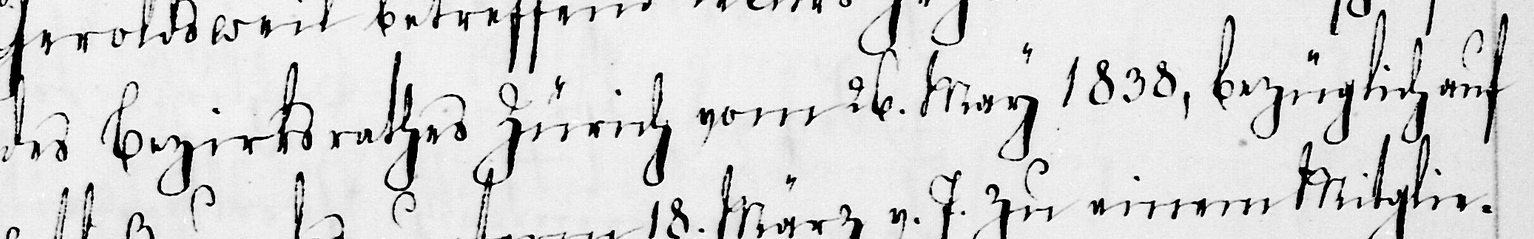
des Bezirksrathes Zürich vom 26. März 1838, bezüglich auf
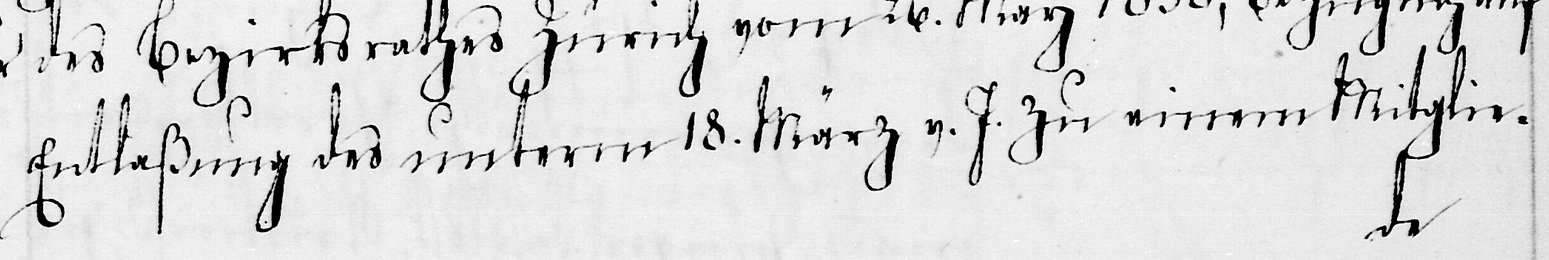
Entlaßung des unterm 18. März v. J. zu einem Mitglie-
